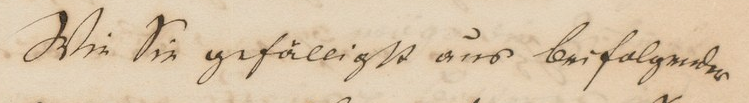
Wie Sie gefälligst aus beifolgender
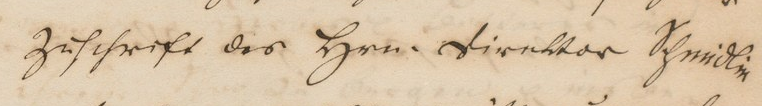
Zuschrift des Hrn. Direktor Schmidlin
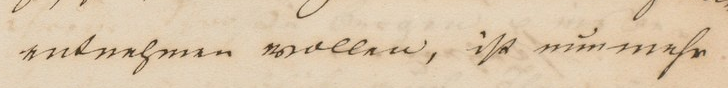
entnehmen wollen, ist nunmehr
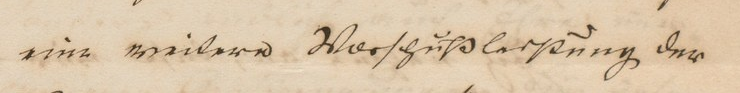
eine weitere Vorschußleistung der
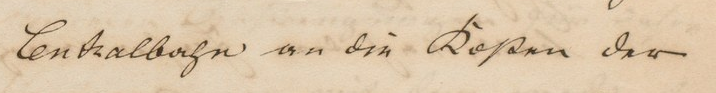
Centralbahn an die Kosten der
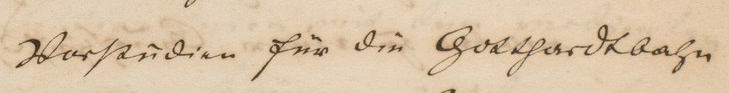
Vorstudien für die Gotthardtbahn
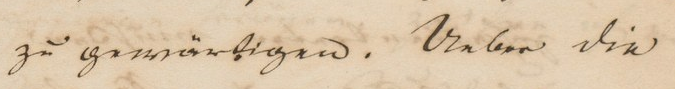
zu gewärtigen. Ueber die
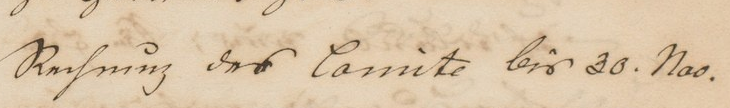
Rechnung des Comite bis 20. Nov.
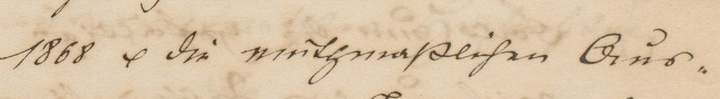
1868 & die muthmaßlichen Aus-
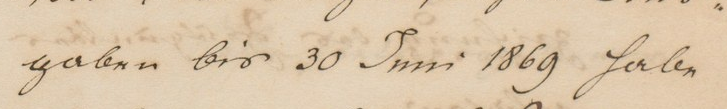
gaben bis 30 Juni 1869 habe
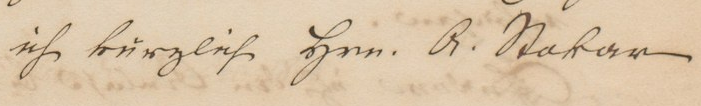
ich kürzlich Hrn. A. Stokar
